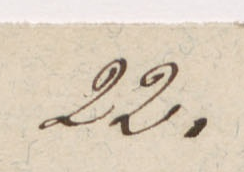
22.
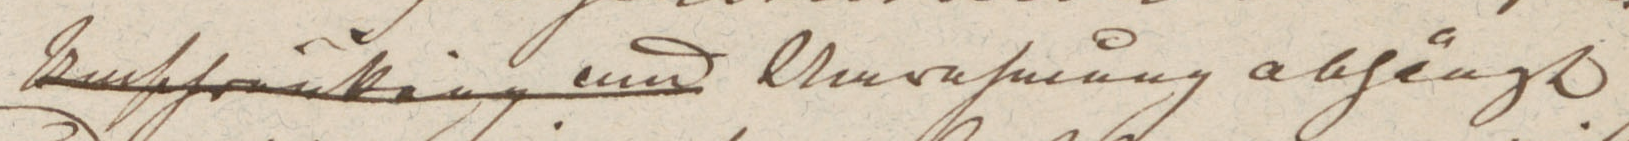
Umschränkung und Umrahmung abhängt
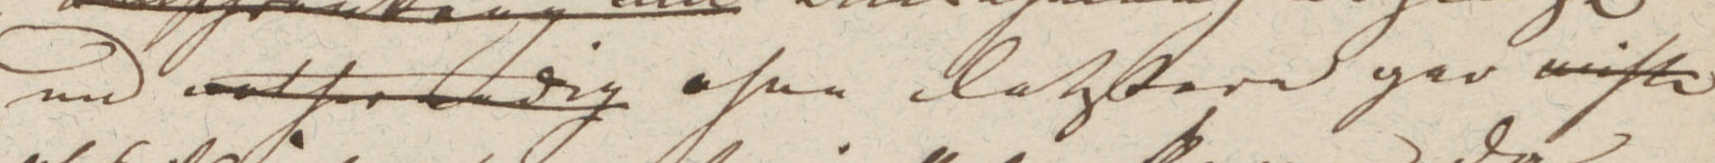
und nothwendig ohne letztere gar nicht
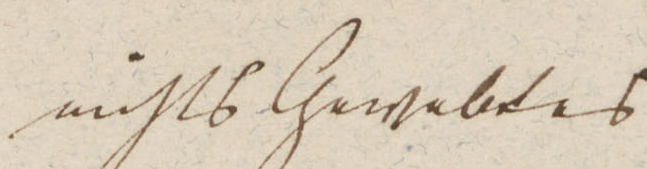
nichts Gewebtes
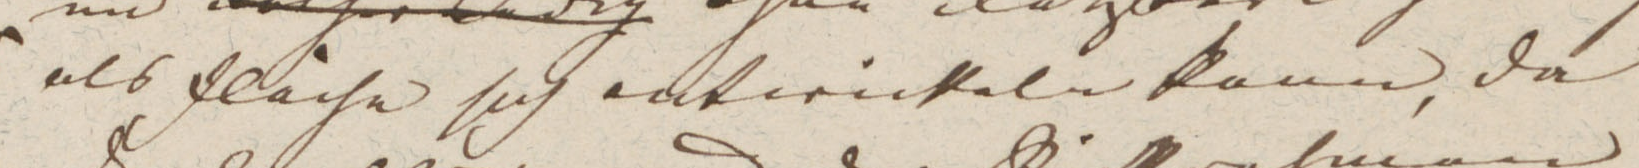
als Fläche sich entwickeln kann, da
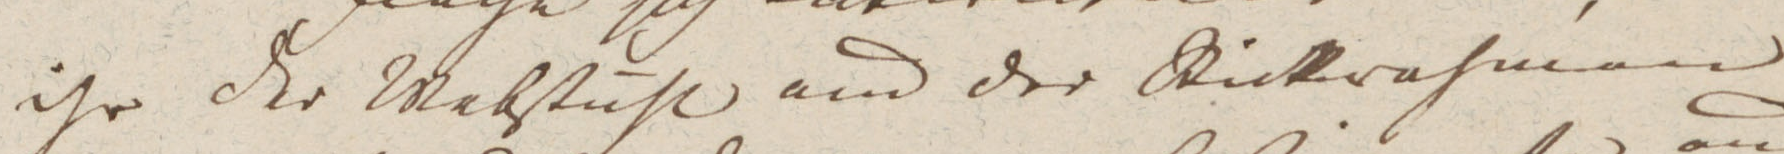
ihr der Webstuhl und der Stickrahmen
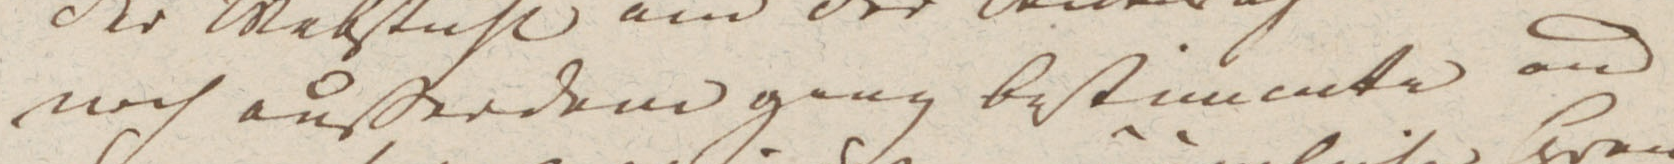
noch ausserdem ganz bestimmte und
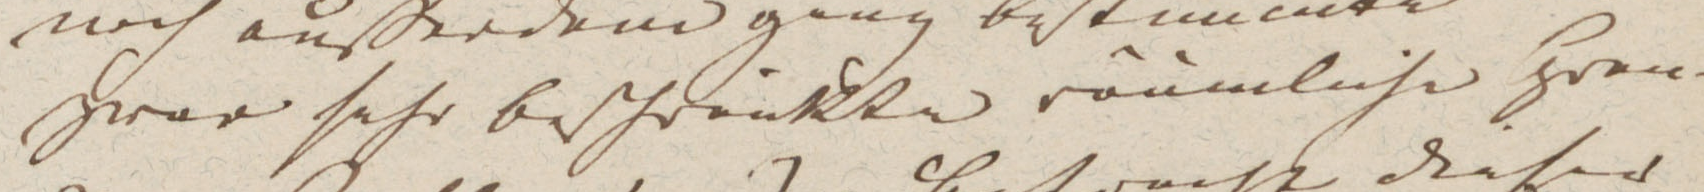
zwar sehr beschränkte räumliche Gren-
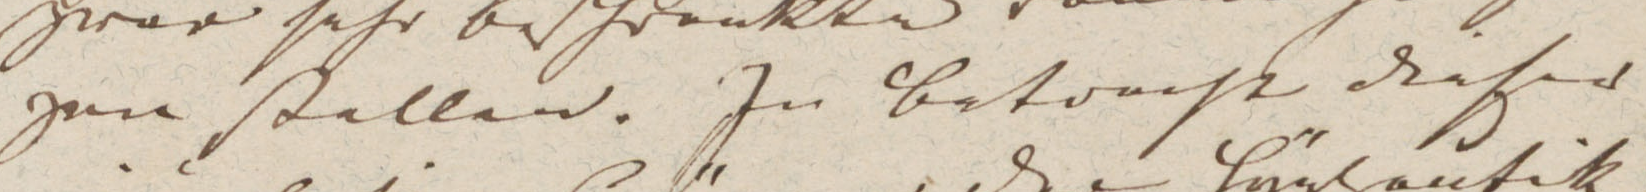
zen stellen. In Betracht dieser
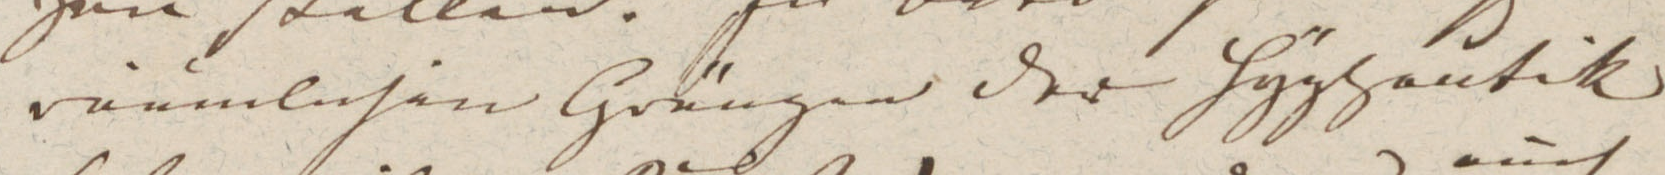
räumlichen Gränzen der Hyphantik
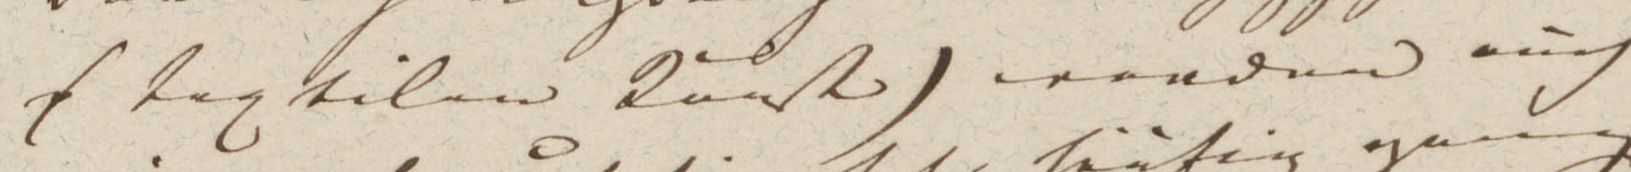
(textilen Kunst) wenden auch
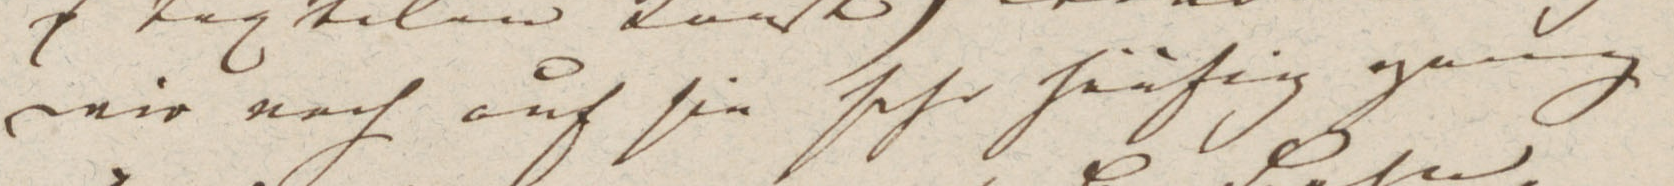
wir noch auf sie sehr häufig geng
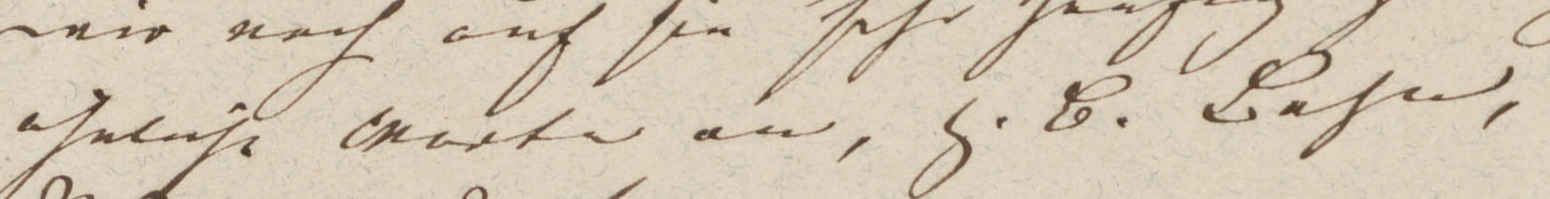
ähnliche Worte an, z. B. Bahn,
